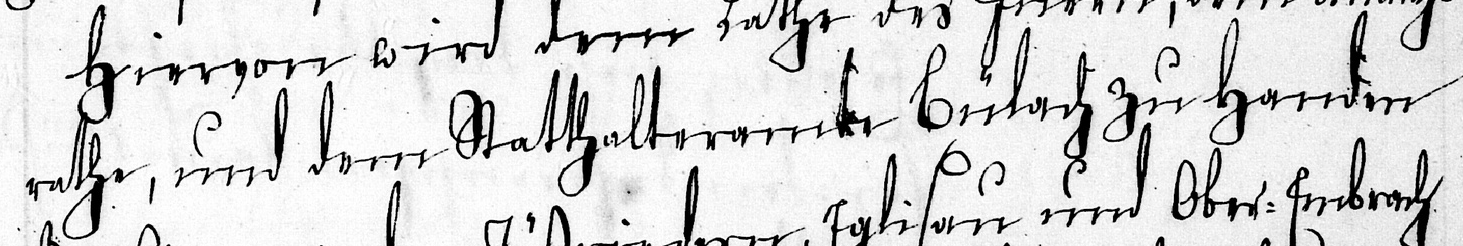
rathe, und dem Statthalteramte Bülach zu Handen
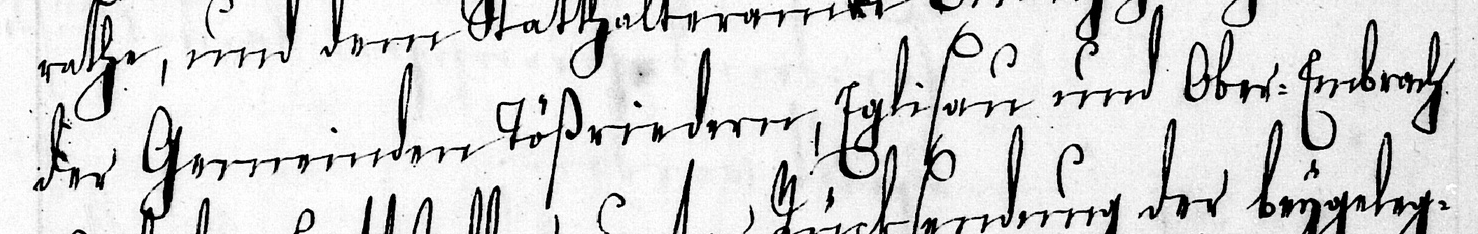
der Gemeinden Tößriedern, Eglisau und Ober-Embrach
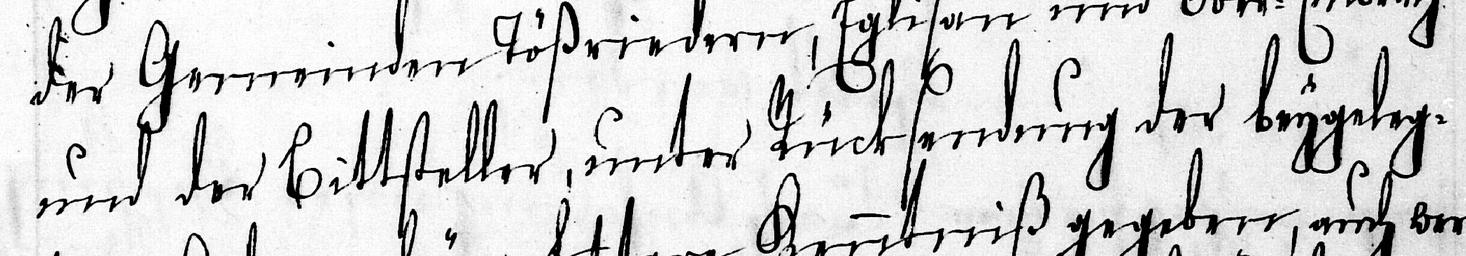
und der Bittsteller, unter Rücksendung der beygeleg¬
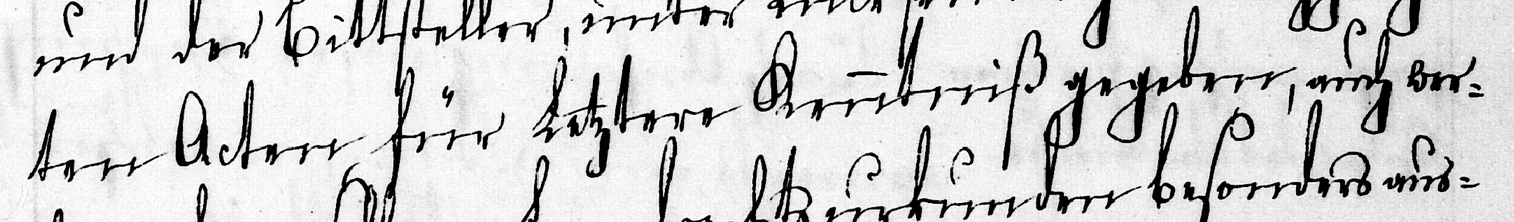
ten Acten für Letztere Kenntniß gegeben, auch wer¬
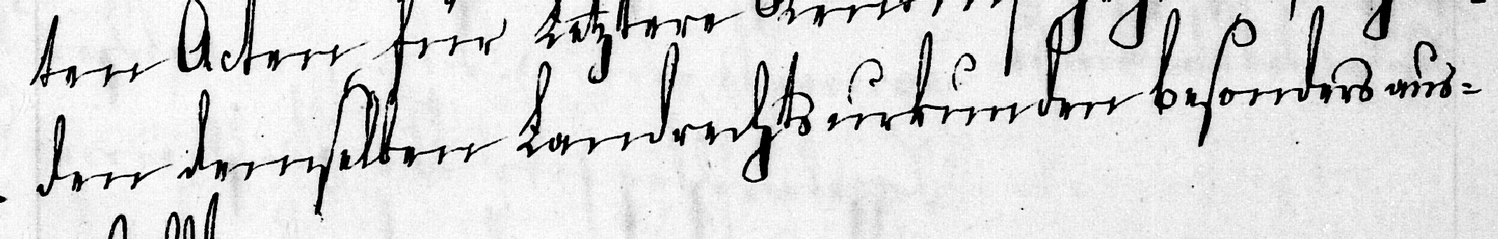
den denselben Landrechtsurkunden besonders aus¬
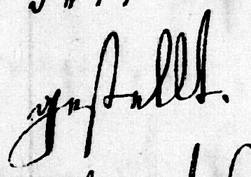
estellt.
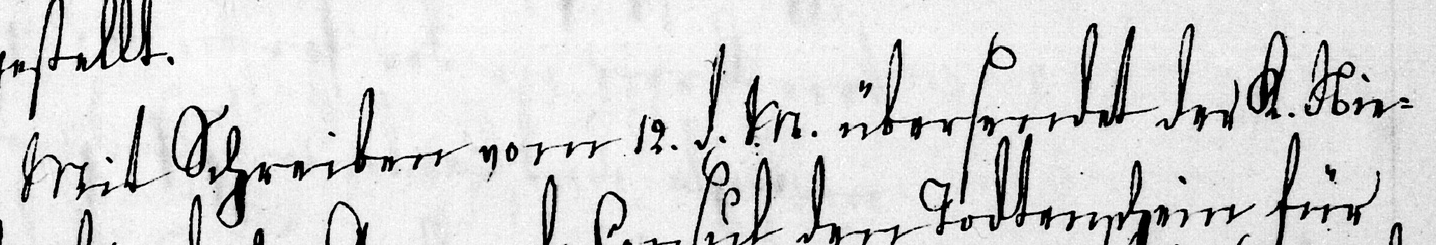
Mit Schreiben vom 12. d. M. übersendet der K. Nie¬
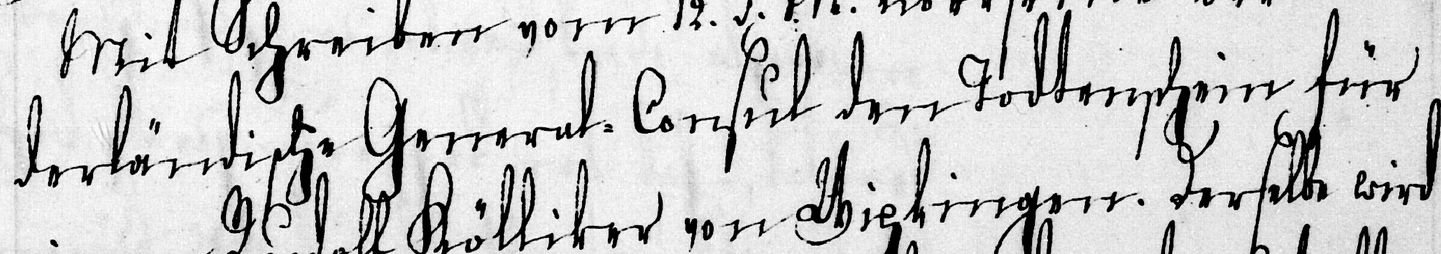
derländische General-Consul den Todtenschein für
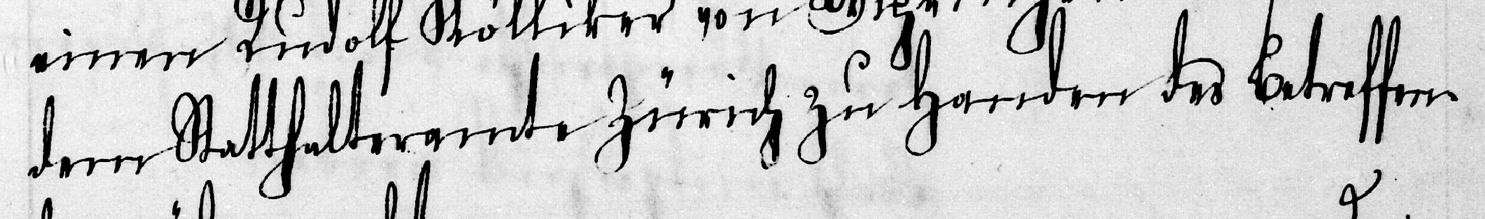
dem Statthalteramte Zürich zu Handen des Betreffe¬
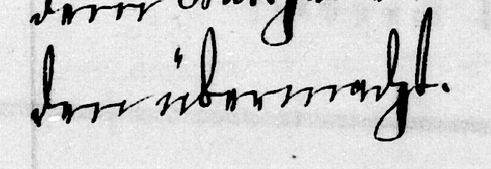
nden übermacht.
